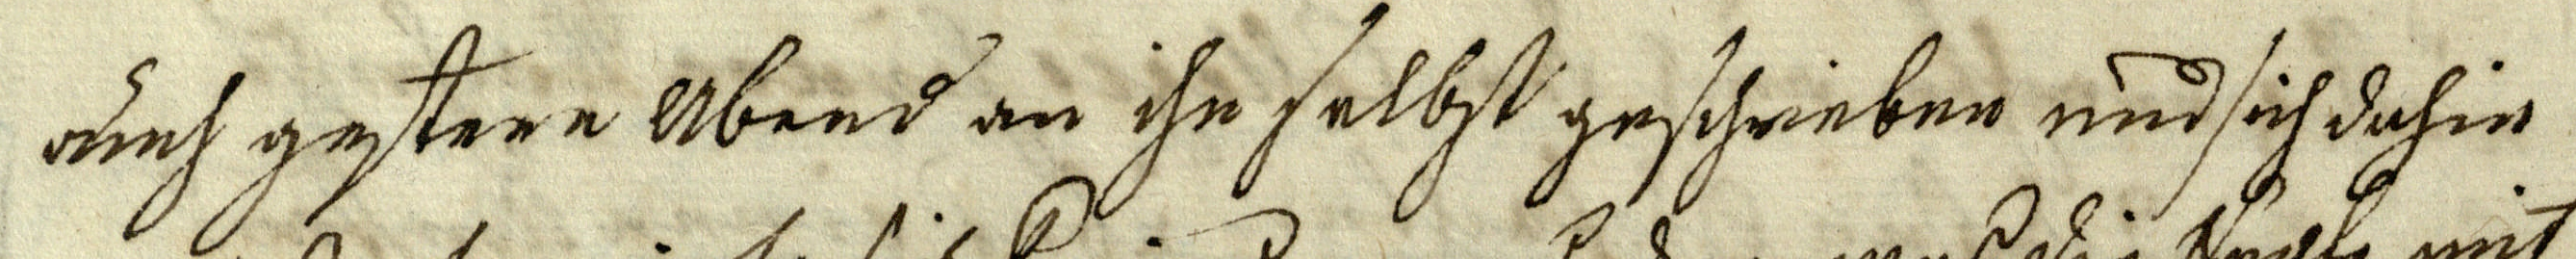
auch gestern Abend an Ihn selbst geschrieben und sich dahin
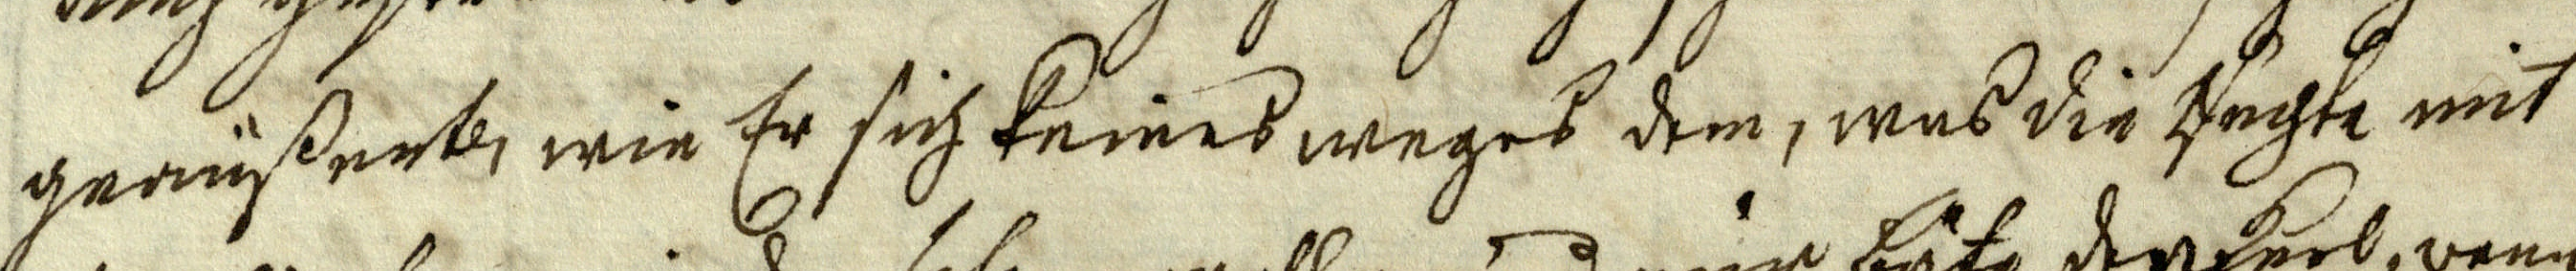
geäußert, wie Er sich keines weges dem, was was die Rechte mit
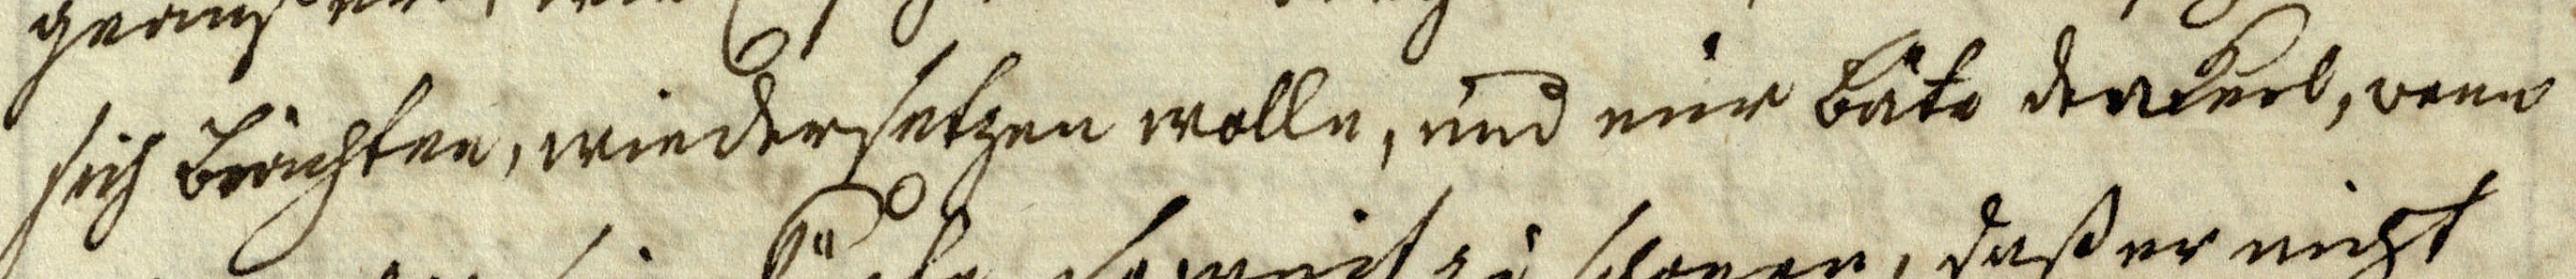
sich brächten, wiedersetzen wolle, und nur bäte den Kerl, wenn
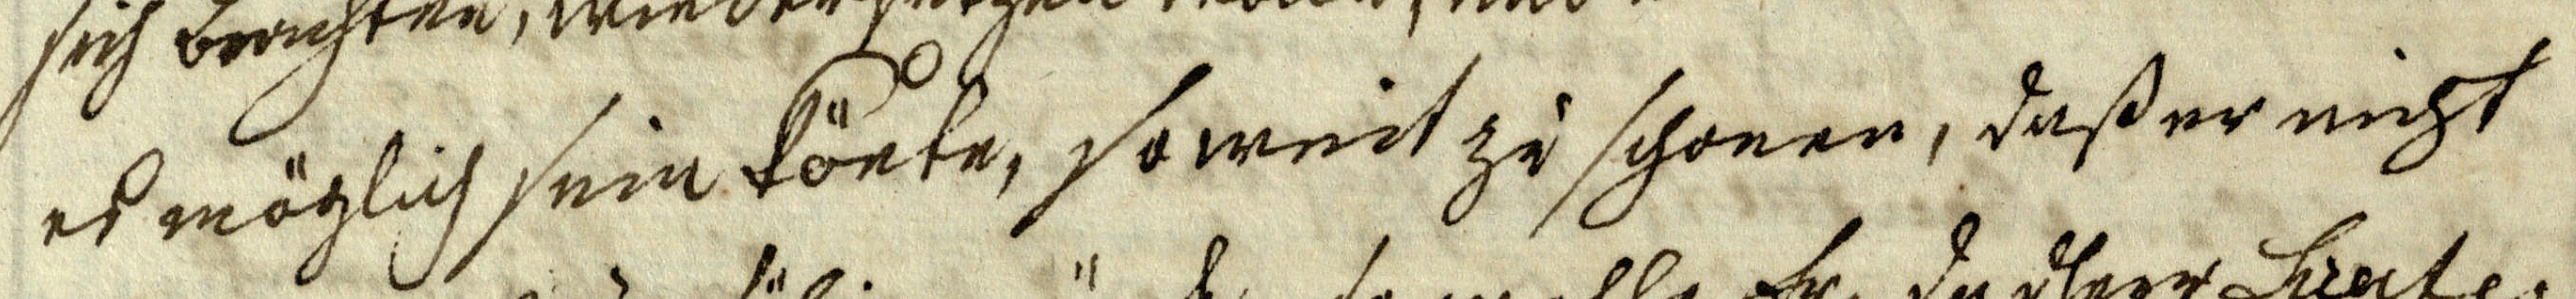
es möglich sein könte, soweit zu schonen, daß er nicht
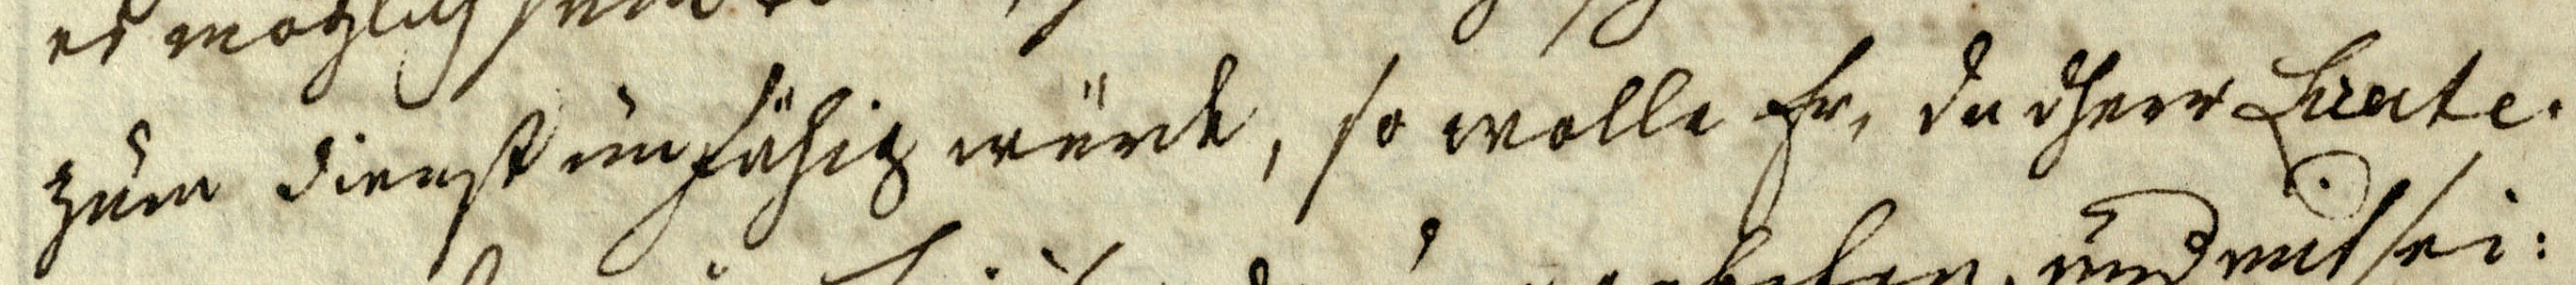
zum Dienst unfähig würde, so wolle Er, da dherr Lieute¬
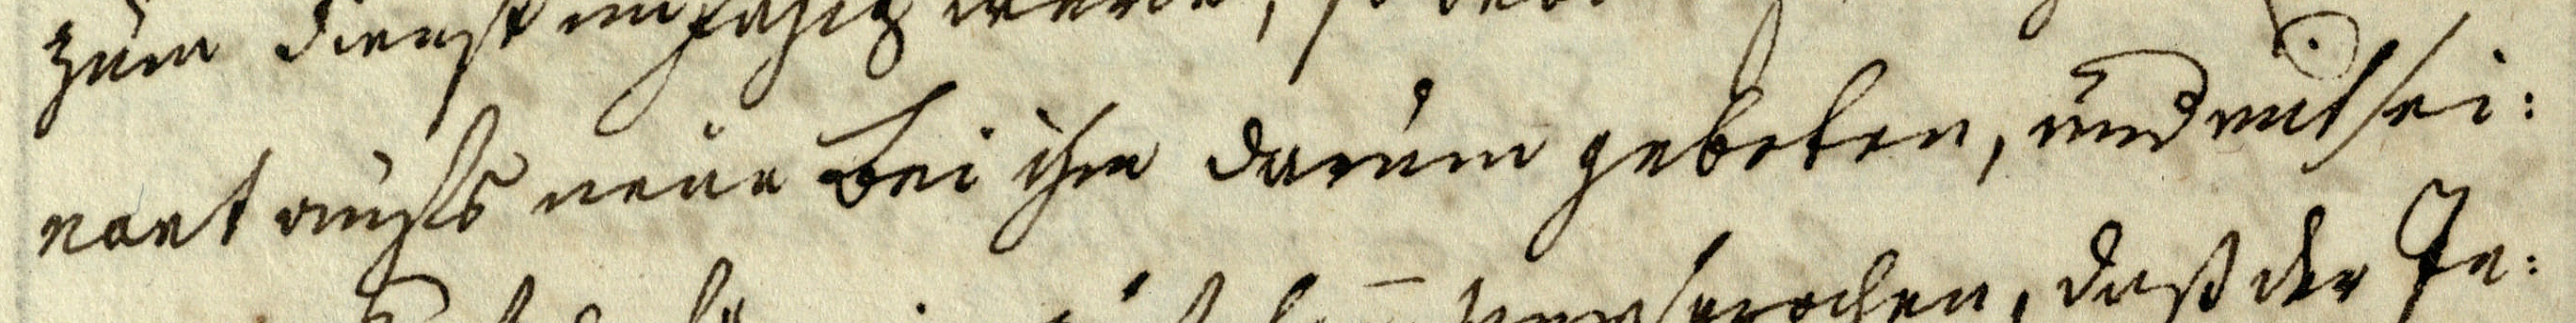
nant aufs neue bei ihm darum gebeten, und mit sei¬
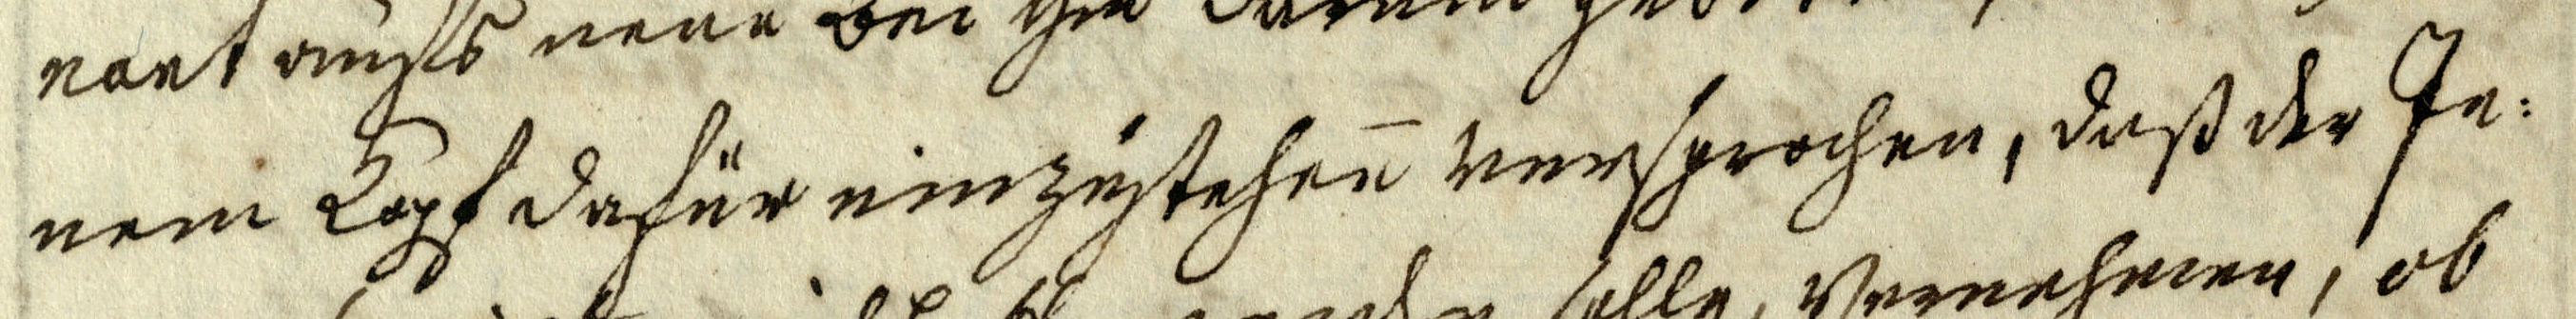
nem Kopf dafür einzustehen versprochen, daß der In¬
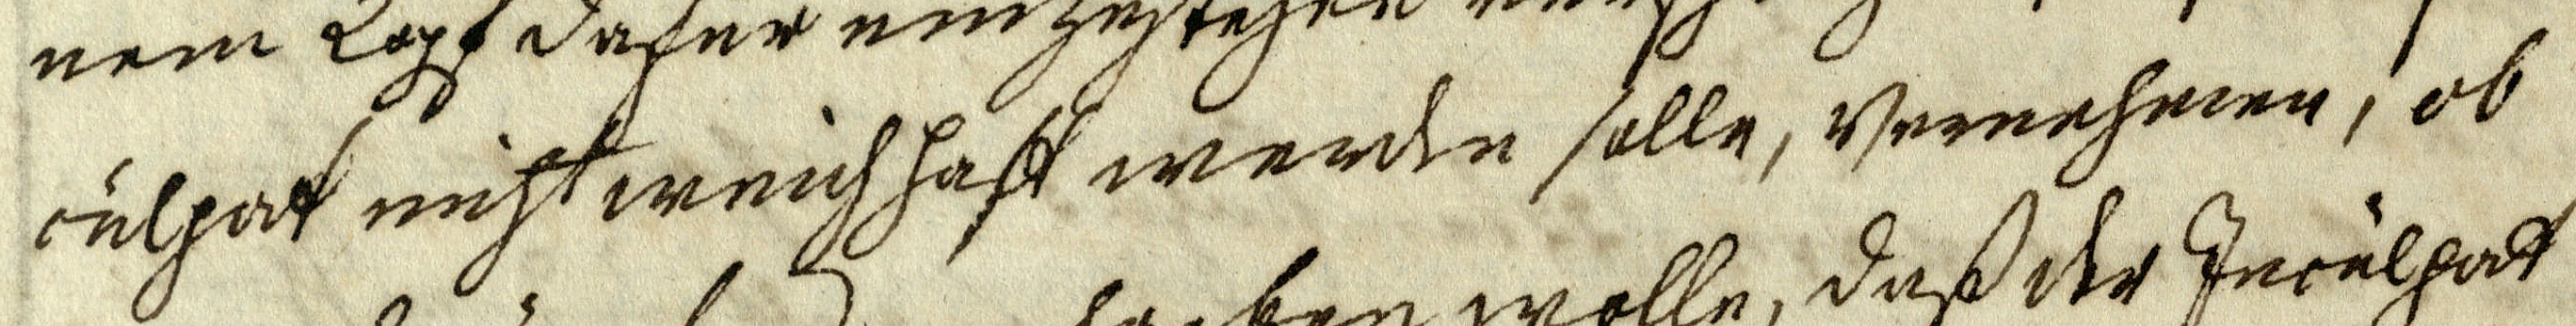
culpat nicht weichhaft werden solle, vernehmen, ob
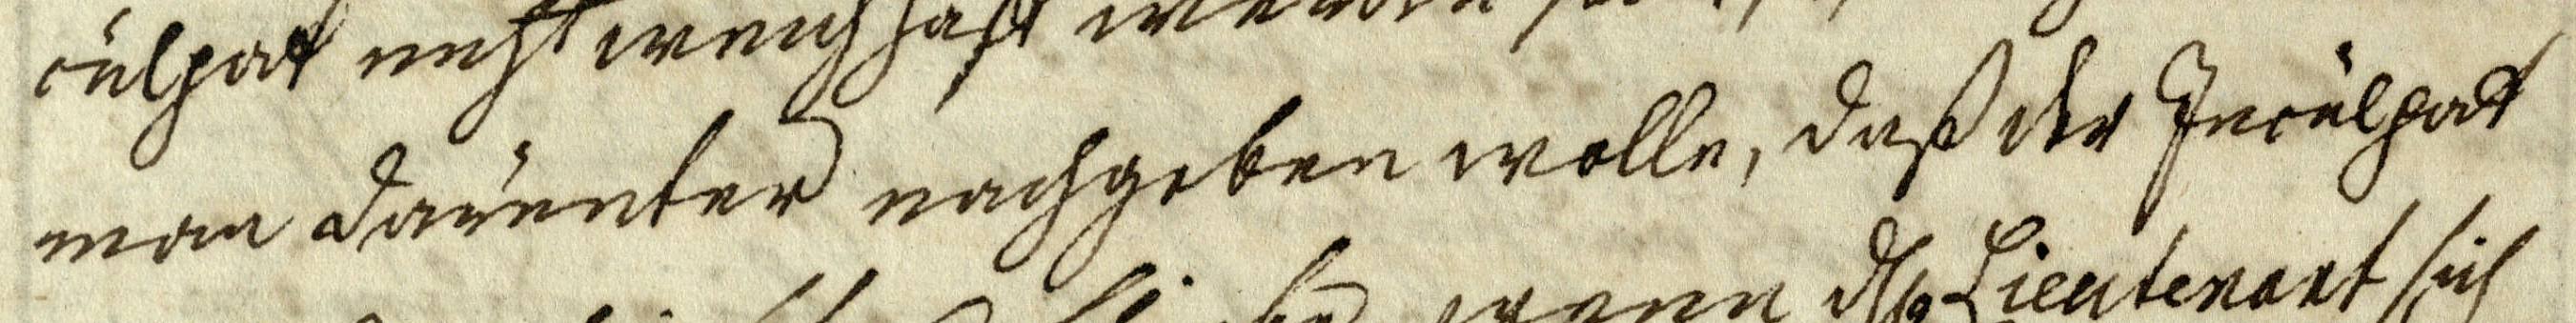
man darunter nachgeben wolle, daß der Inculpat
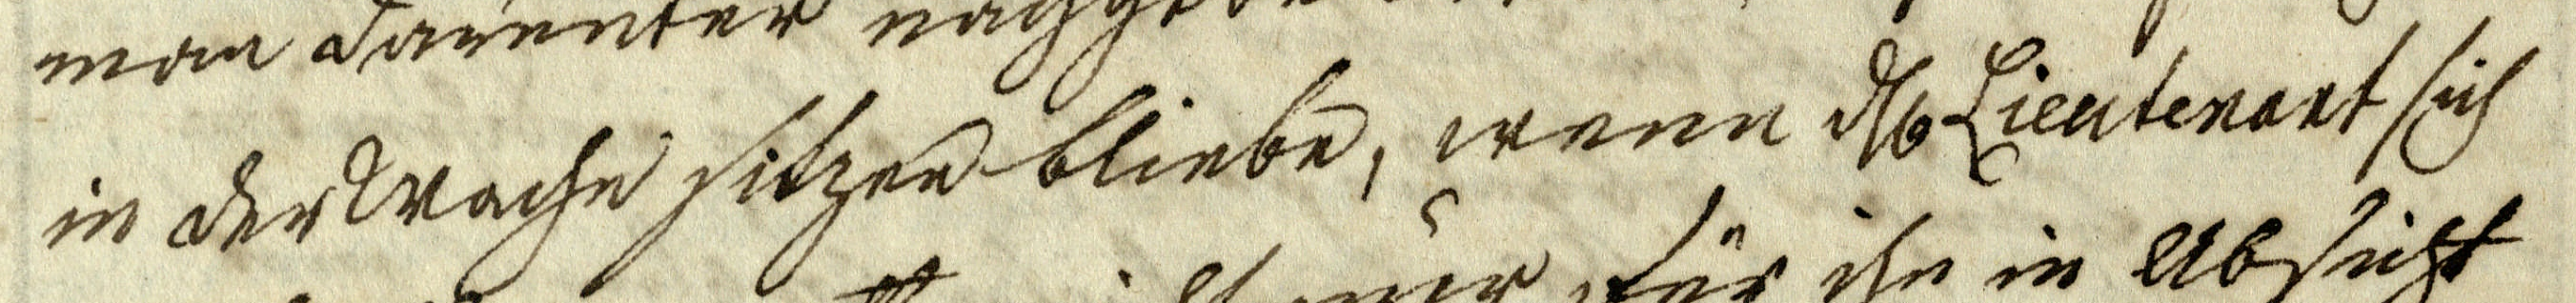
in der Wache sitzen bliebe, wenn dh Lieutenant sich
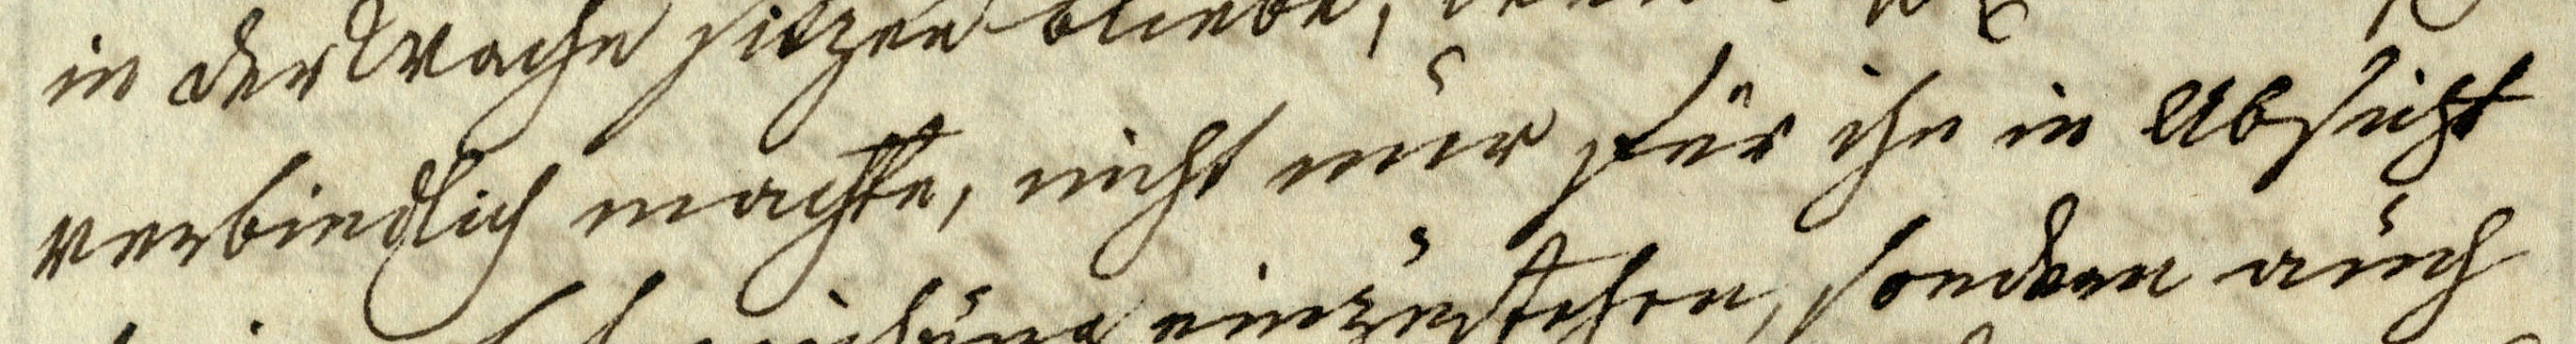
verbindlich machte, nicht nur für ihn in Absicht
